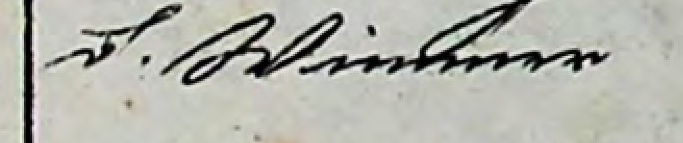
v. Wimmer
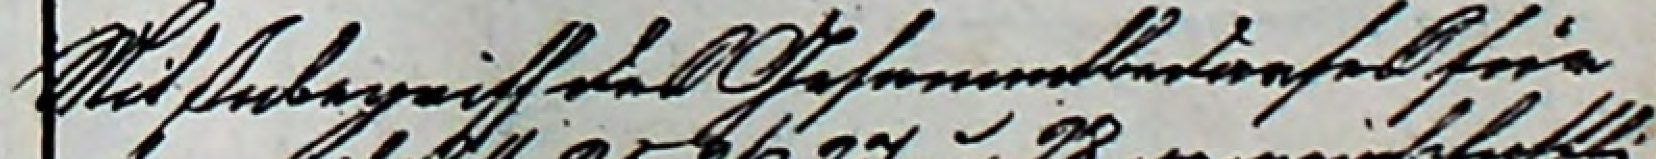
Mit Inbegriff des Gesamtbedarfes für
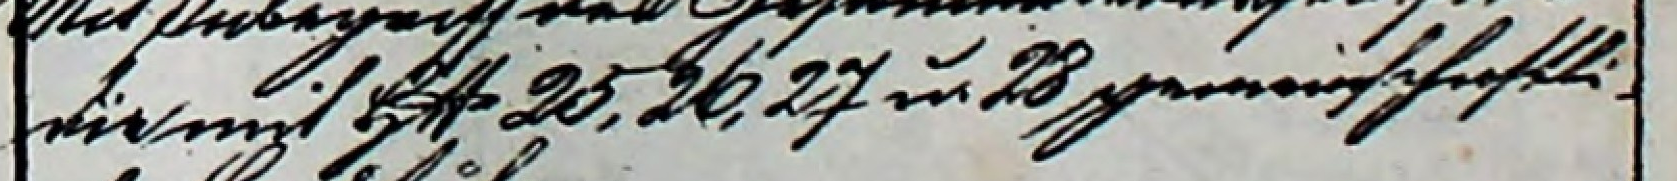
die mit Hn 25, 26, 27 u 28 Gemeinschaftli„
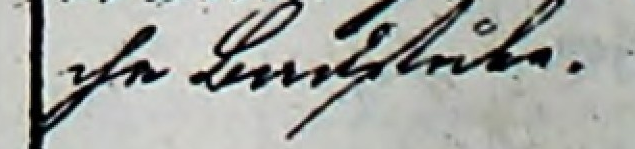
che Badstuben
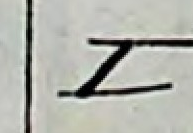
I
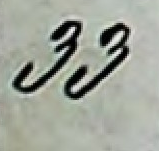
33
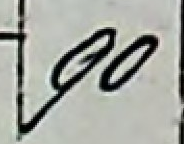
90
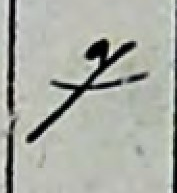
7
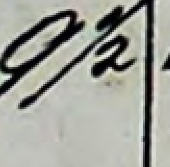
9 1/2
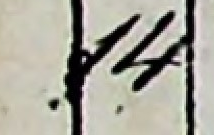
14
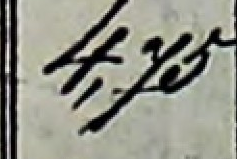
4,75
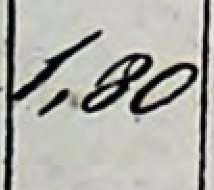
1,80
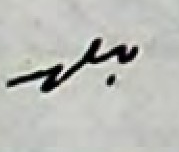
do
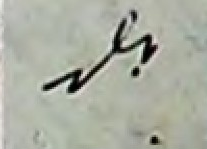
do
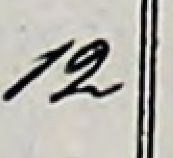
12
